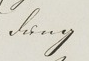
dung»
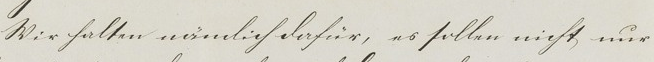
Wir halten nämlich dafür, es sollen nicht nur
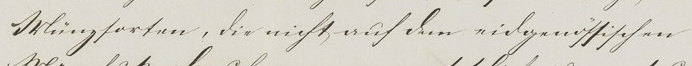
Münzsorten, die nicht auf dem eidgenössischen
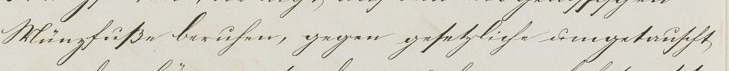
Münzfuße beruhen, gegen gesetzliche umgetauscht
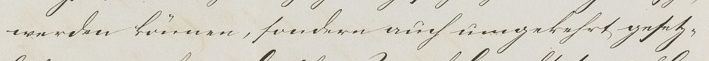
werden können, sondern auch umgekehrt gesetz-
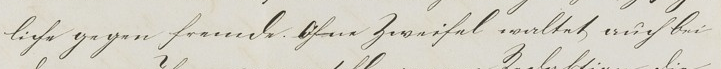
liche gegen fremde. Ohne Zweifel waltet auch bei
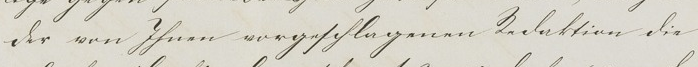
der von Ihnen vorgeschlagenen Redaktion die
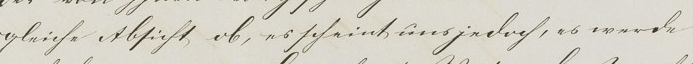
gleiche Absicht ob, es scheint uns jedoch, es werde
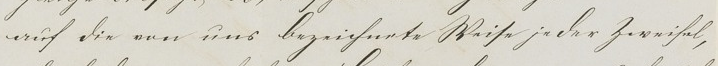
auf die von uns bezeichnete Weise jeder Zweifel,
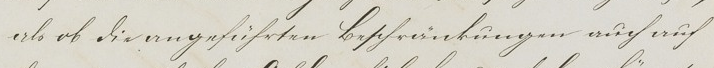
als ob die angeführten Beschränkungen auch auf
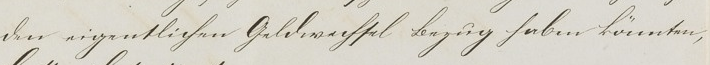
den eigentlichen Geldwechsel Bezug haben könnten,
